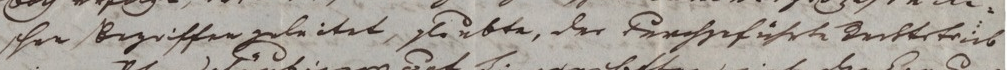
schen Begriffen geleitet, glaubte, der durchgeführte Rechtstrieb
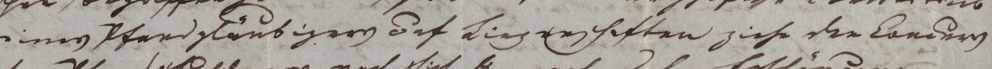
eines Pfandgläubigers auf Liegenschaften ziehe den Concurs
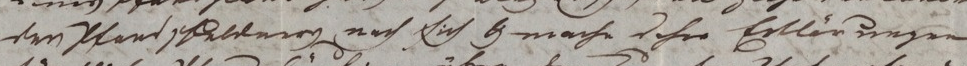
des Pfandschuldners nach sich &mache daher Erklärungen
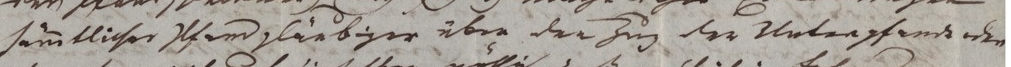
sämmtlicher Pfandgläubiger über den Zug der Unterpfande oder
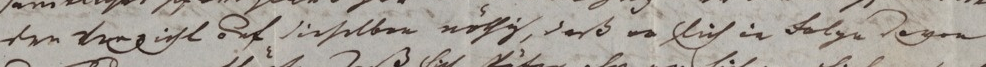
den Verzicht auf dieselben nöthig, daß er sich in Folge davon
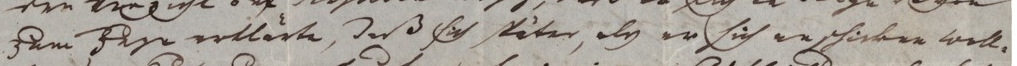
zum Zuge erklärte, daß sich später, als er sich anschicken woll-
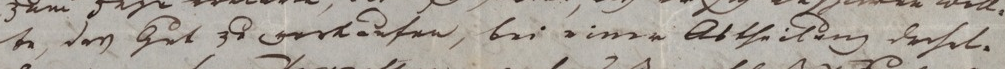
te, das Gut zu verkaufen, bei einer Abtheilung dersel-
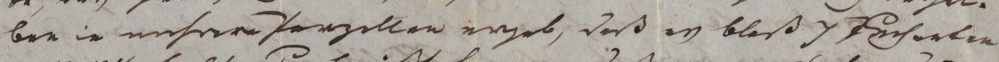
ben in unseren Parzellen ergab, daß es bloß 7 Jucharten
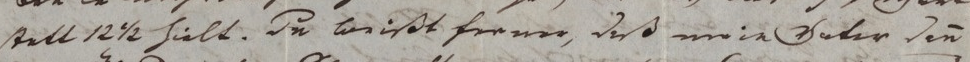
statt 12 ½ hielt. Du weißt ferner, daß mein Vater dann
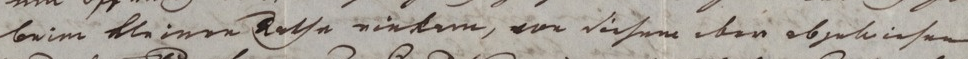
beim kleinen Rathe einkam, von diesem aber abgewiesen
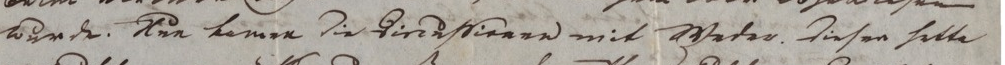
wurde. Nun kamen die Discussionen mit Weder. Dieser hatte
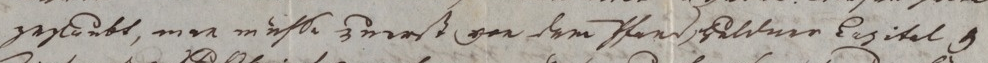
geglaubt, man müsse zuerst von dem Pfandschuldner Capital &
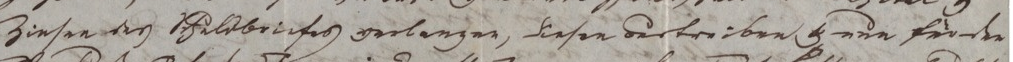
Zinsen des Schuldbriefes verlangen, diesen austreiben & nun für den
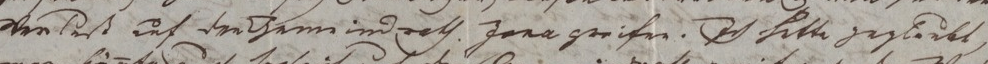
Verlust auf den Gemeinderath Jona greifen. Ich hatte geglaubt,
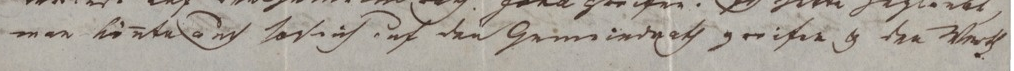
man könnte auch sogleich auf den Gemeindrath greifen &den Werth
